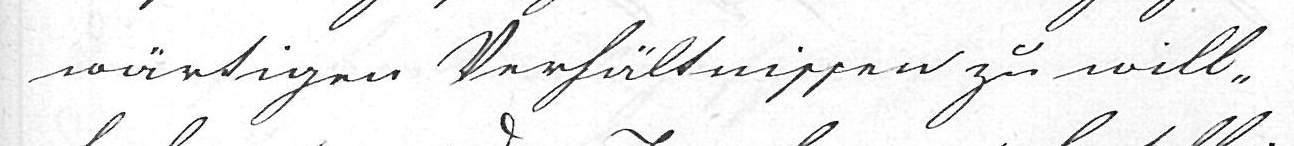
wärtigen Verhältnissen zu will-
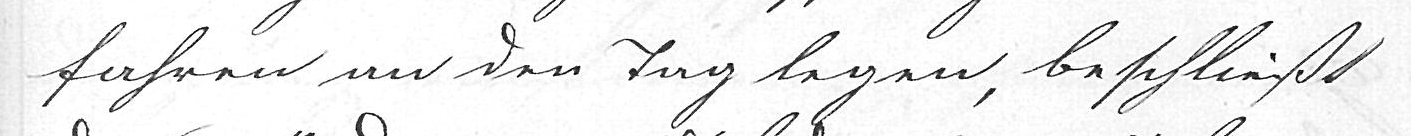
fahren an der Tag legen, beschließt
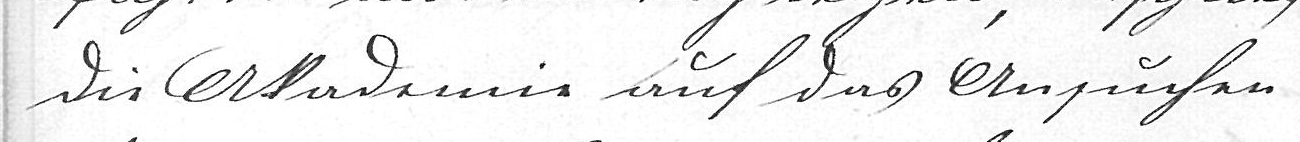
die Akademie auf des Ansuchen
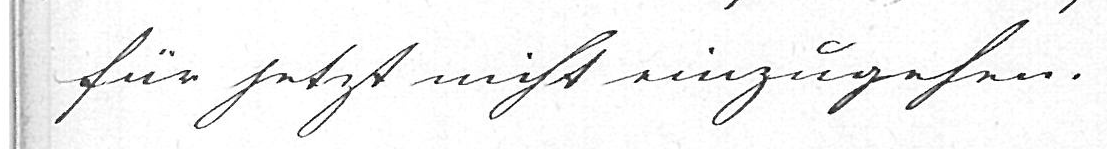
für jetzt nicht einzugehen.
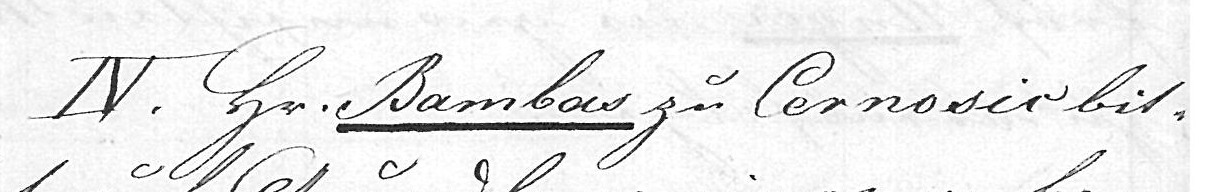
IV. Hr. Bambas zu Carnosic bit-
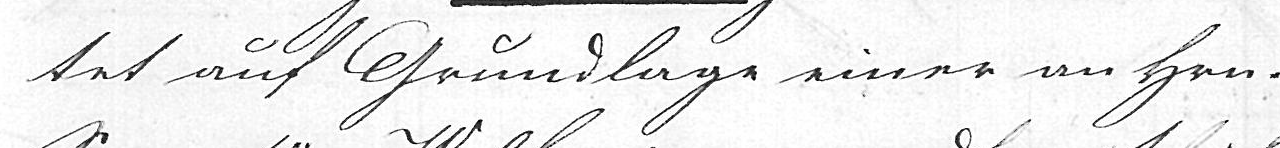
tet auf Grundlage einer an Hrn.
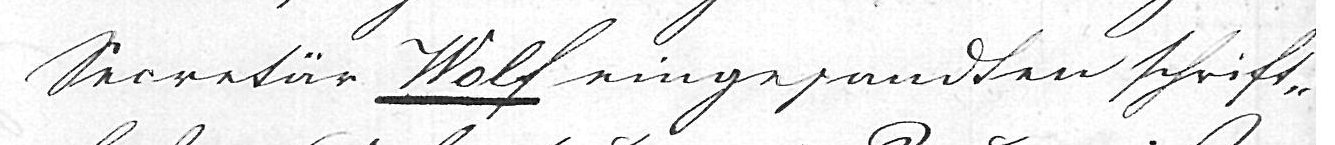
Secretär Wolf eingesandten schrift-
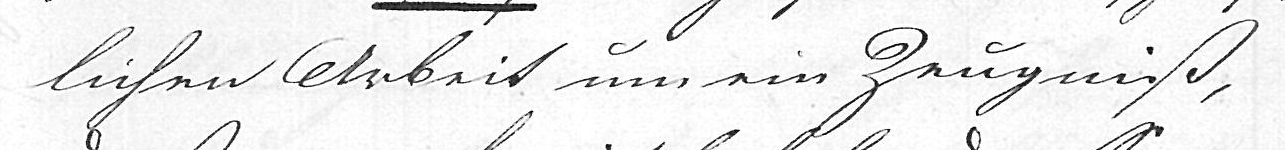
lichen Arbeit um ein Zeugniß,
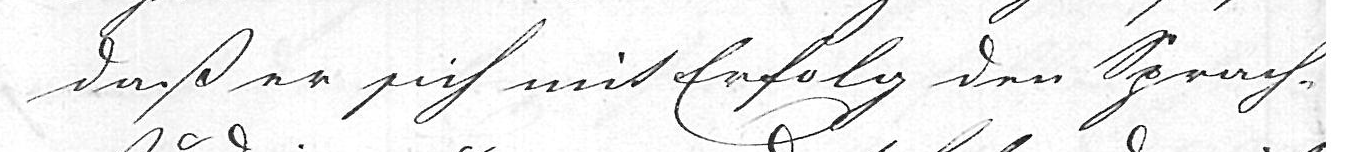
daß er sich mit Erfolg den Sprach-
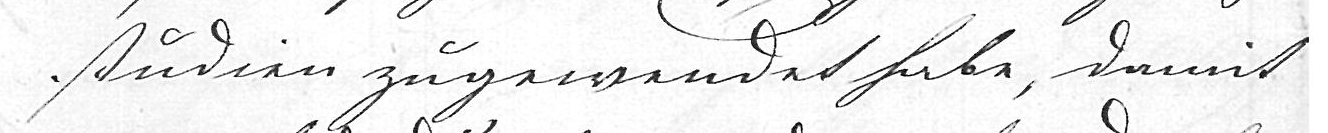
studien zugewendet habe, damit
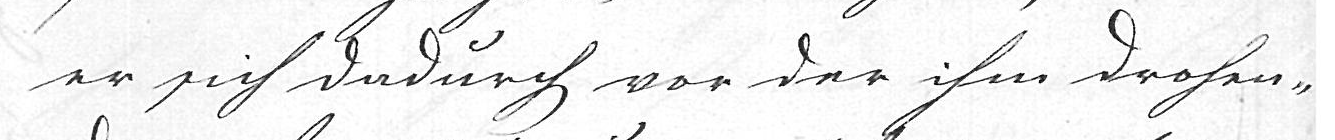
er sich dadurch vor der ihm drohen-
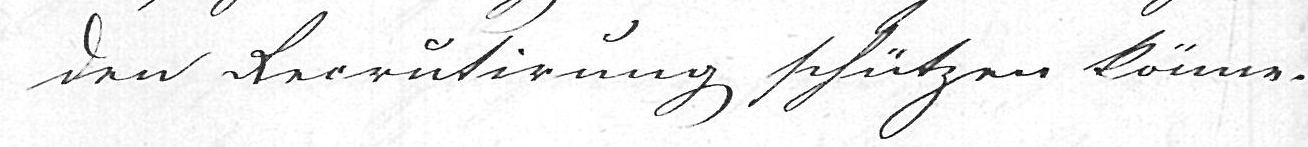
den Recrutirung schützen könne.
